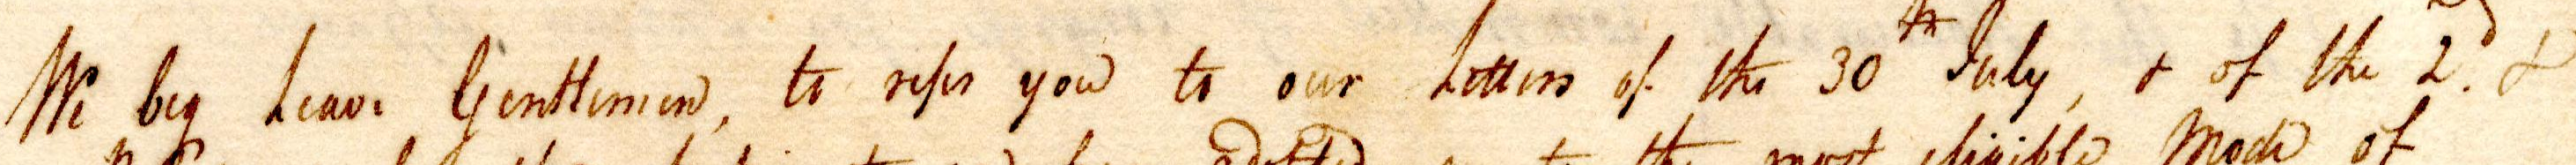We beg Leave Gentlemen, to refer you to our Letters of the 30^th July, & of the 2^d.
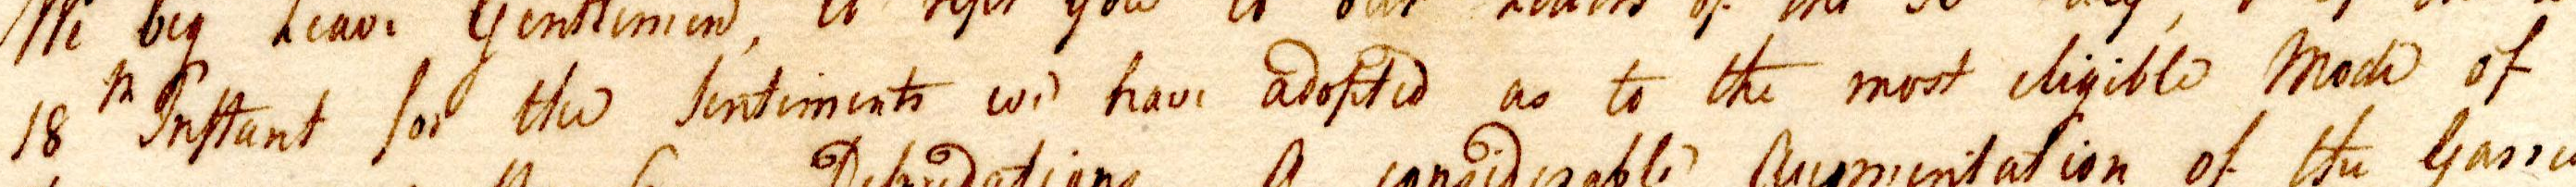18^th Instant for the Sentiments we have adopted as to the most eligible mode of
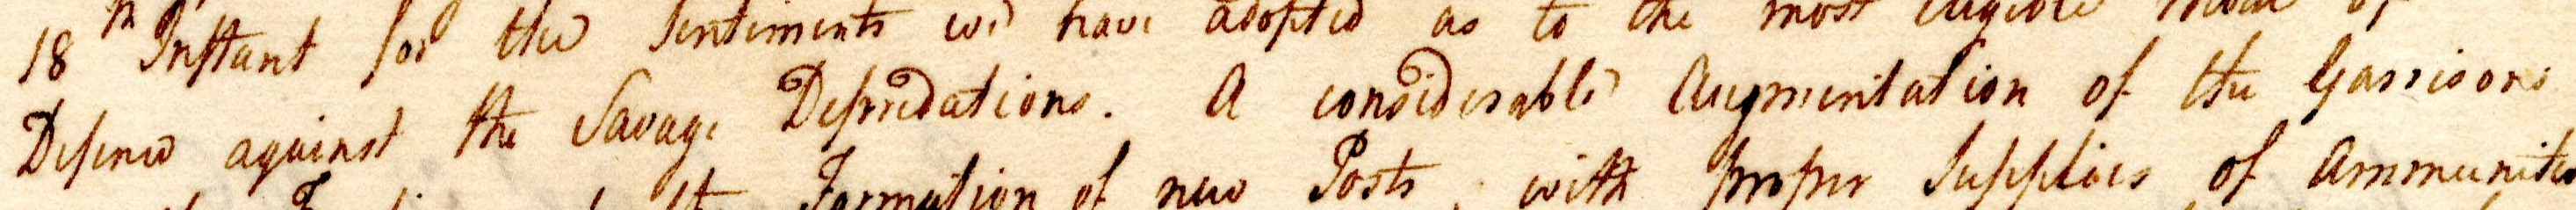Defense against the Savage Depredations. A considerable Augmentation of the Garrisons
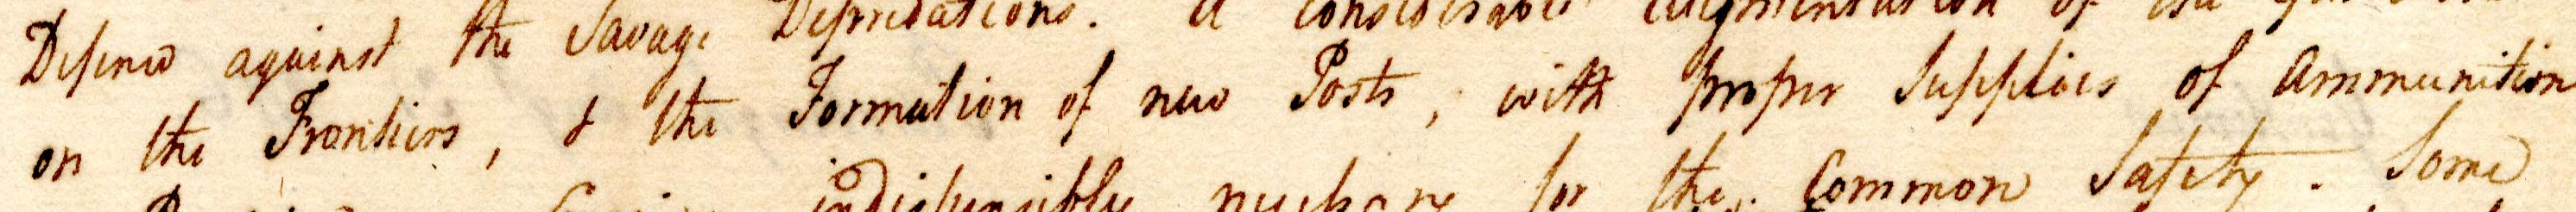on the Frontiers, & the Formation of new Posts, with proper Supplies of Ammunition
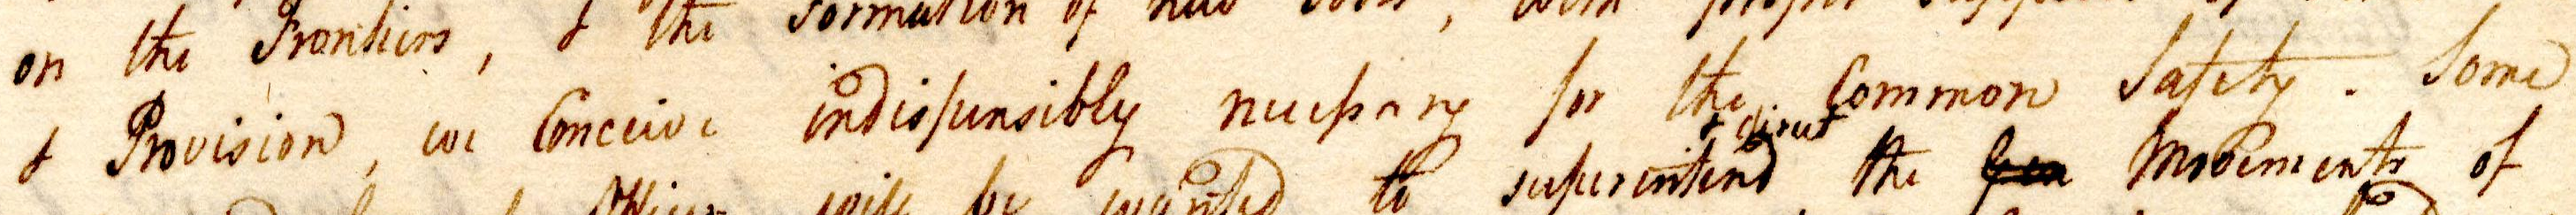& Provision, we Conceive indispensibly necessary for the Common Safety. Some
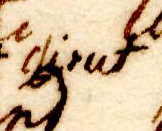& direct
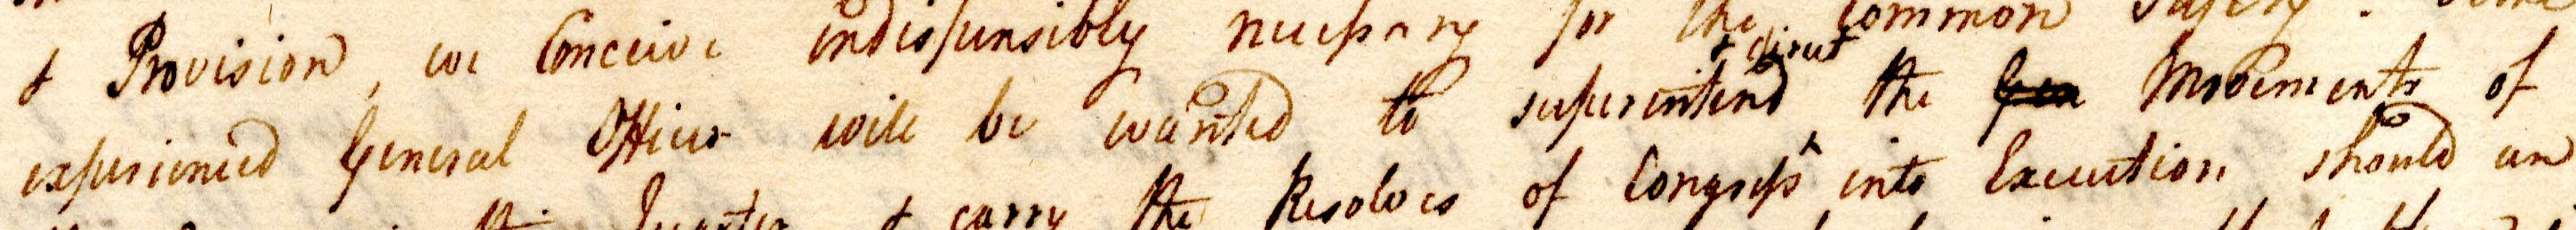experienced General Officer will be wanted to superintend ^ the Movements of
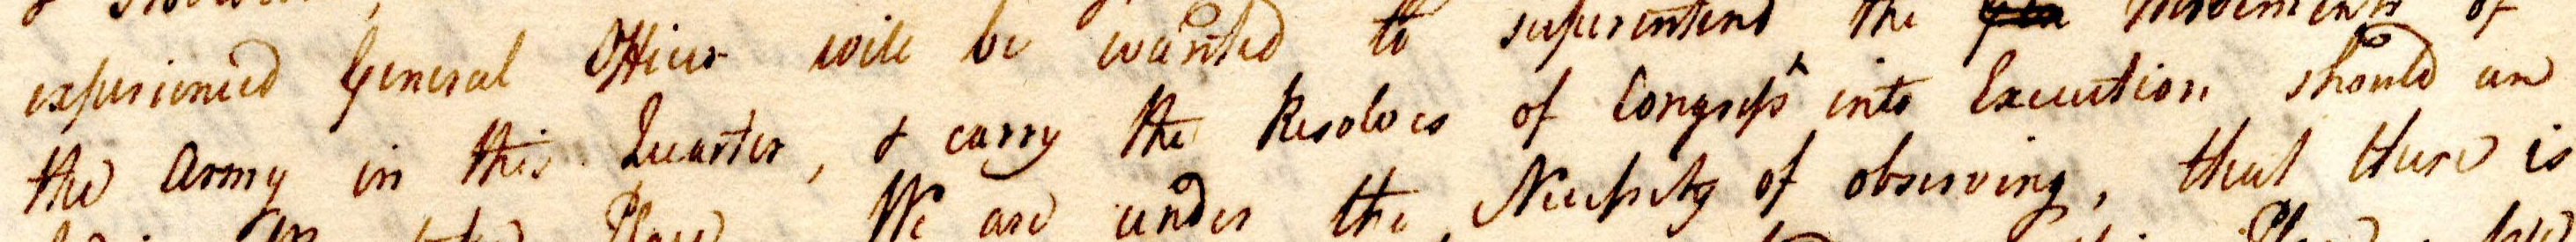the Army in this Quarter, & carry the Resolves of Congress into Execution should an
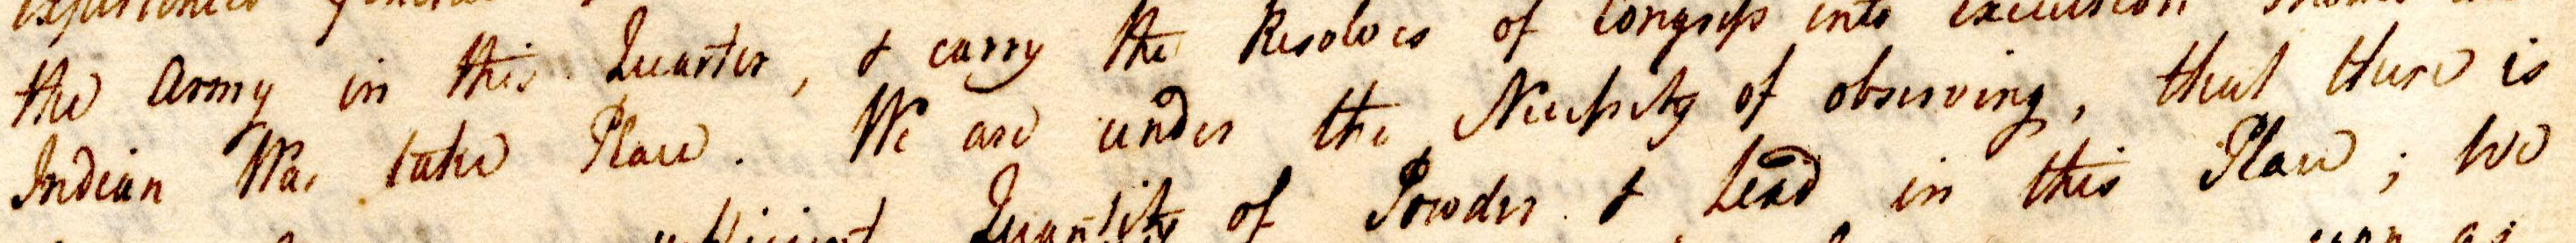Indian War take Place. We are under the Necessity of observing, that there is
